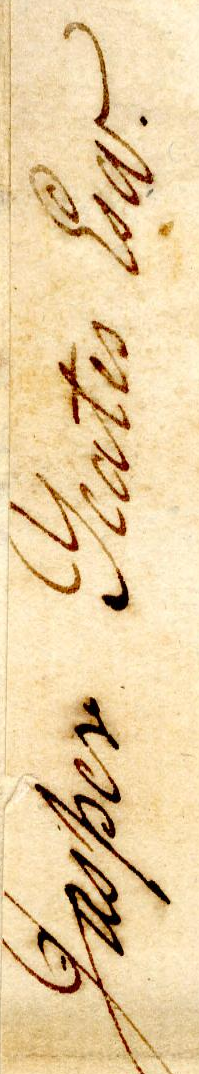Jasper Yeates Esq^r.
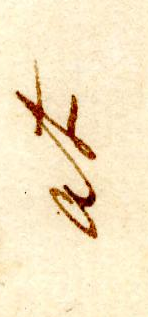at
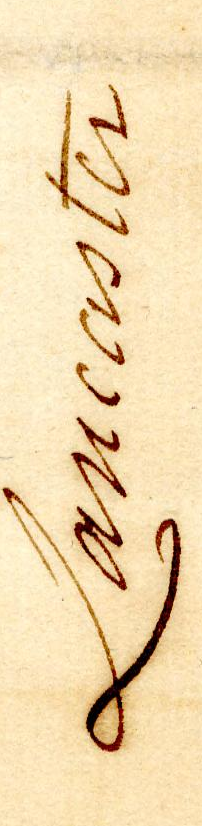Lancaster
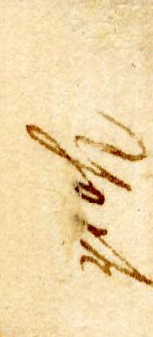York
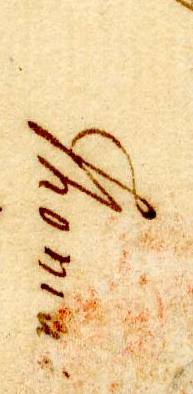Thomas
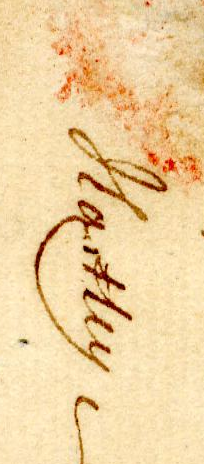Hartley
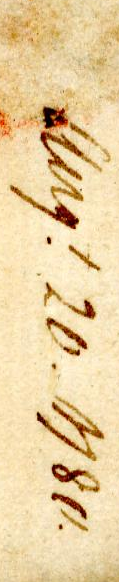Aug^t. 20. 1780
